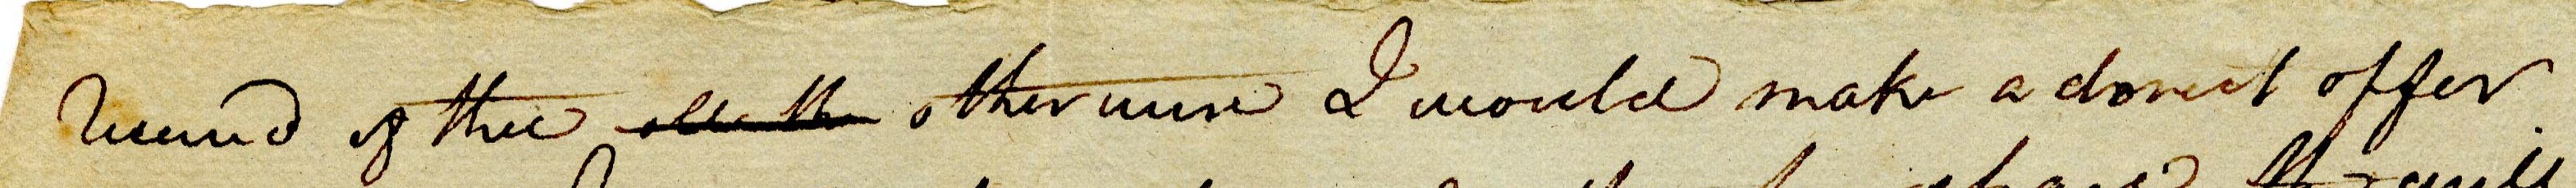received of the [_____] other men I would make a dorect offer
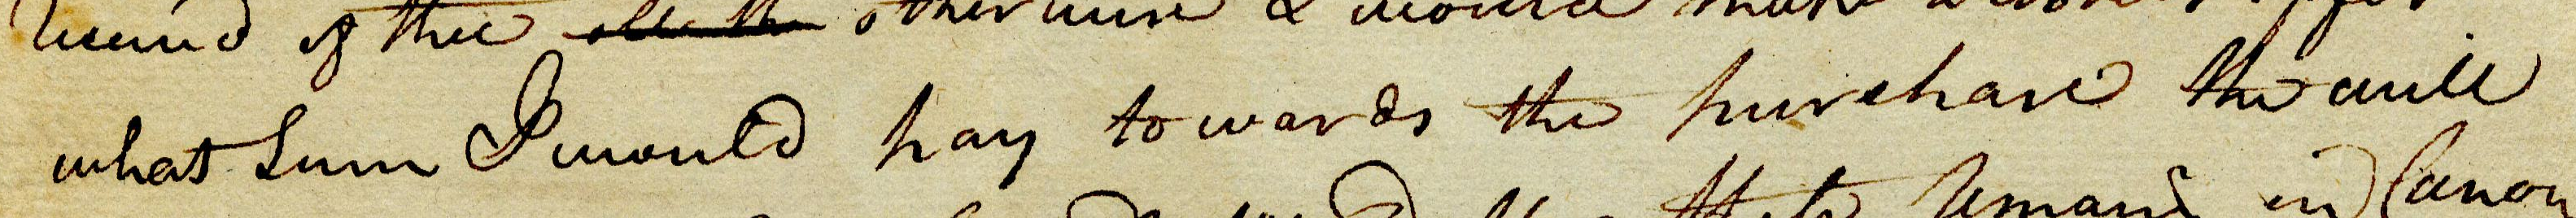what sum I would pay towards the purchase the will
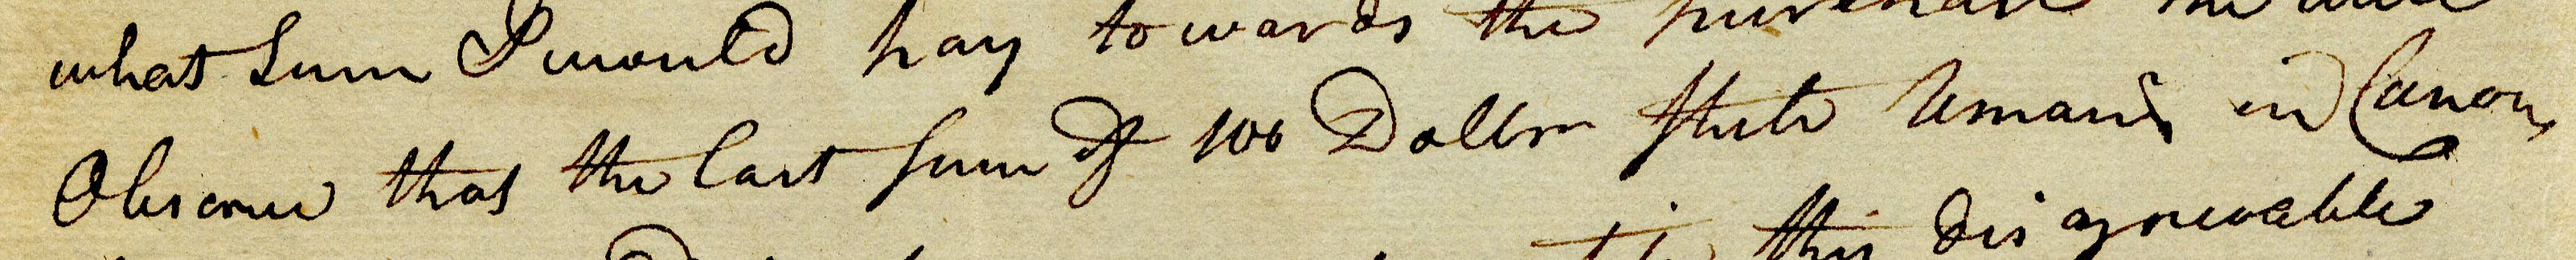Observe that the last sum of 100 Dollar still remains in Canons
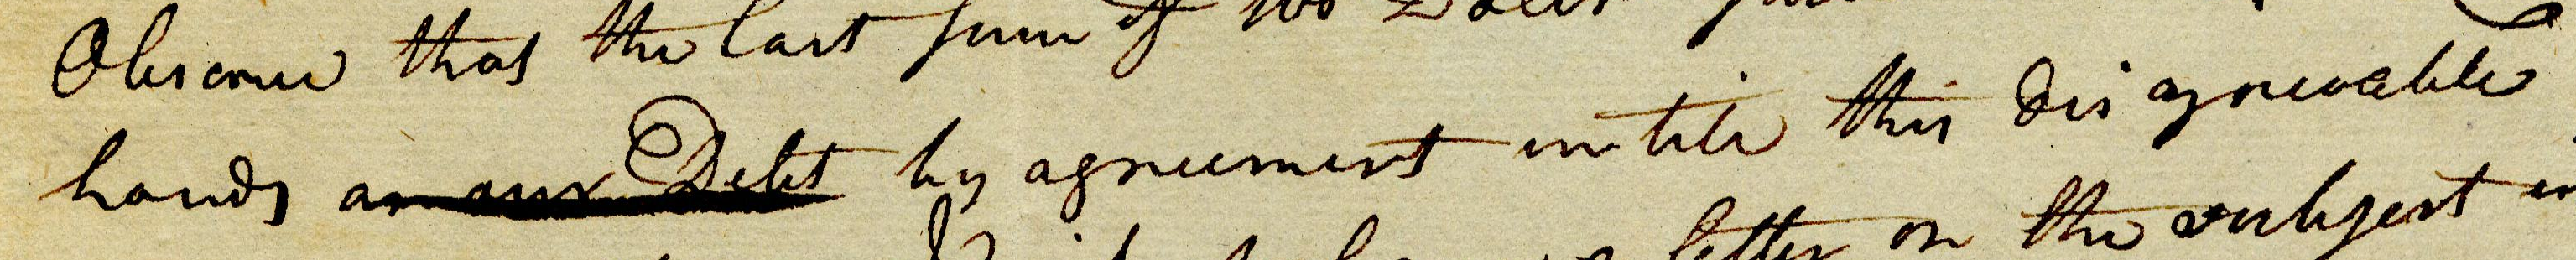hands [as our Debt] by agreement untill this disagreeable
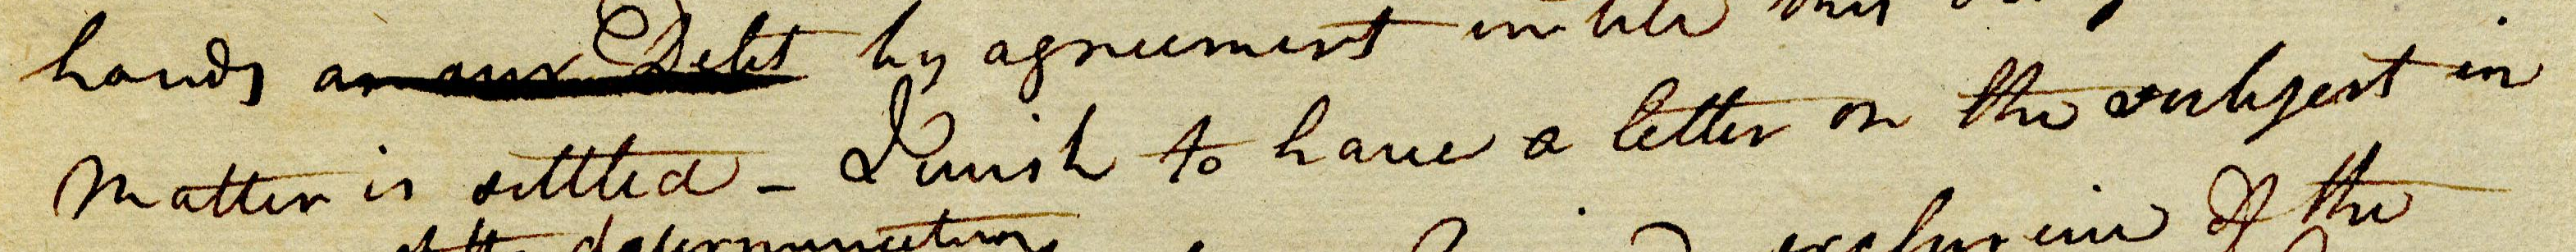matter is settled- I wish to have a letter on the subject in
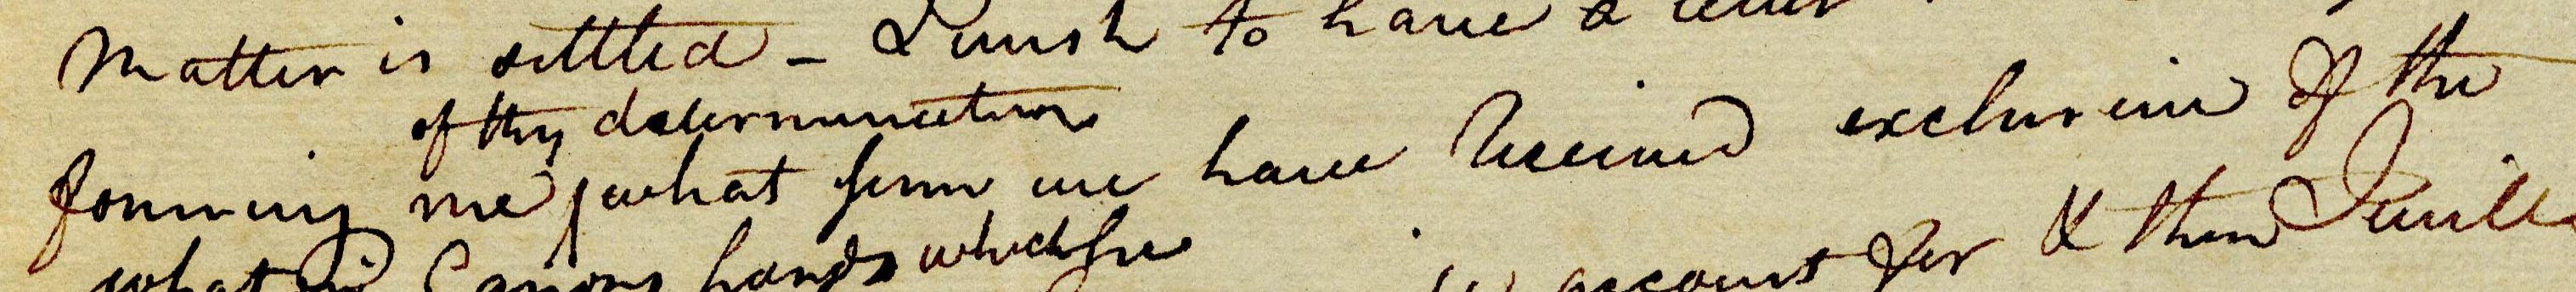forming me ^ what sum we have received exclusive of the
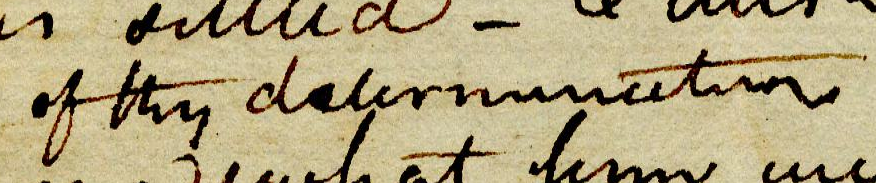of thy determination
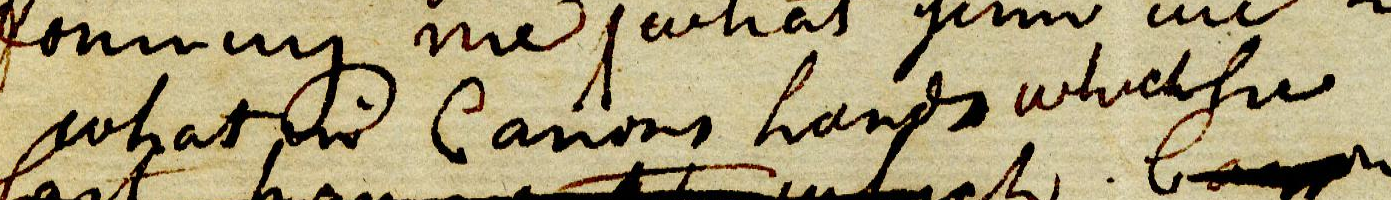what in Canons hands which su
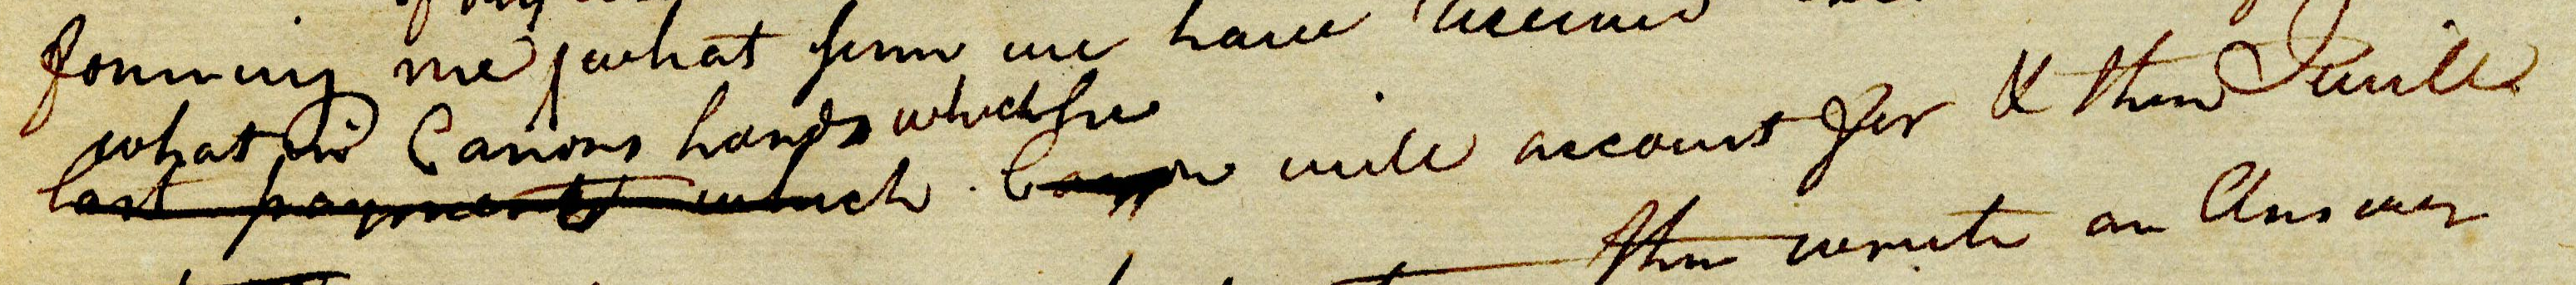[last payment which] [Canan] will account for & then I will
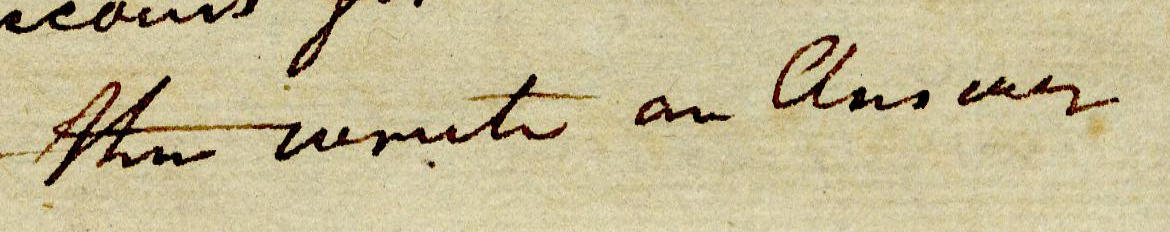the write an Answer
